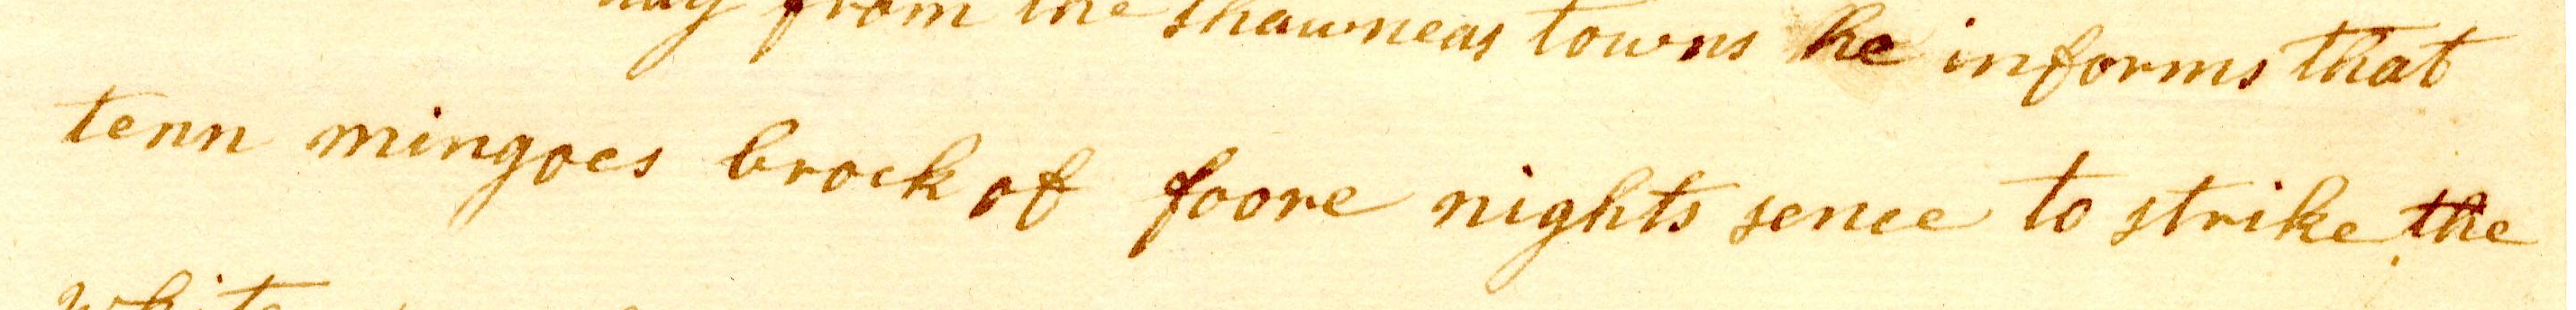tenn mingoes brock of foore nights sence to strike the
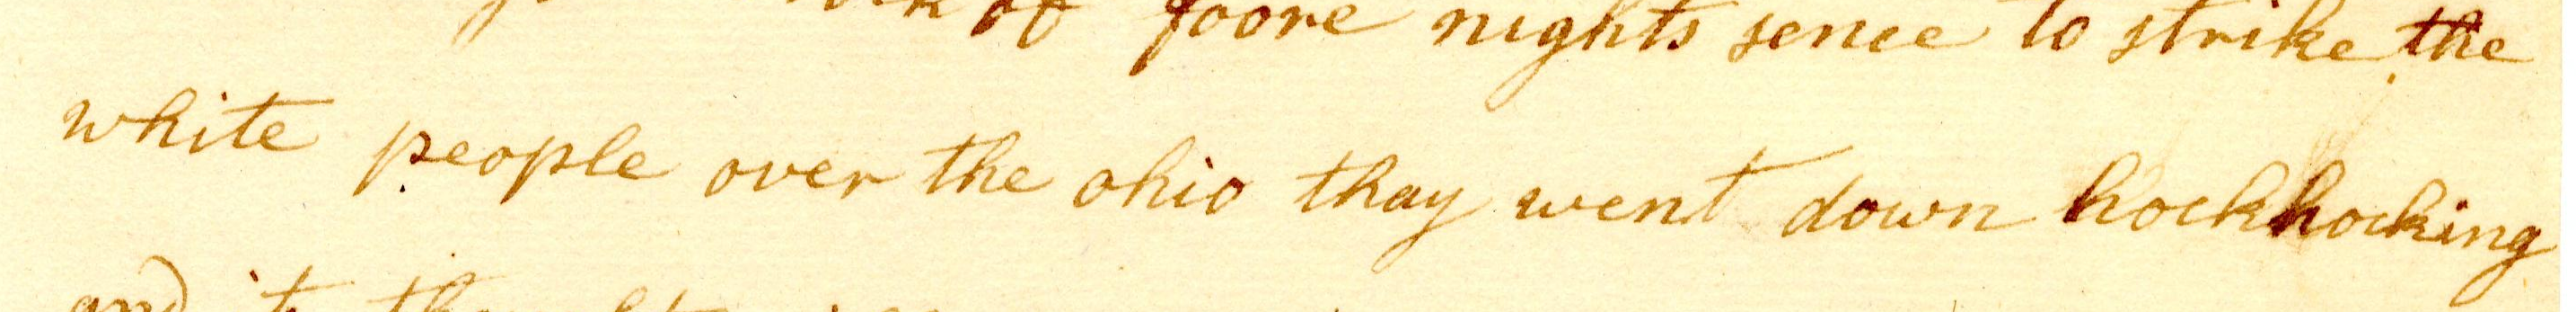white people over the ohio thay went down hockhocking
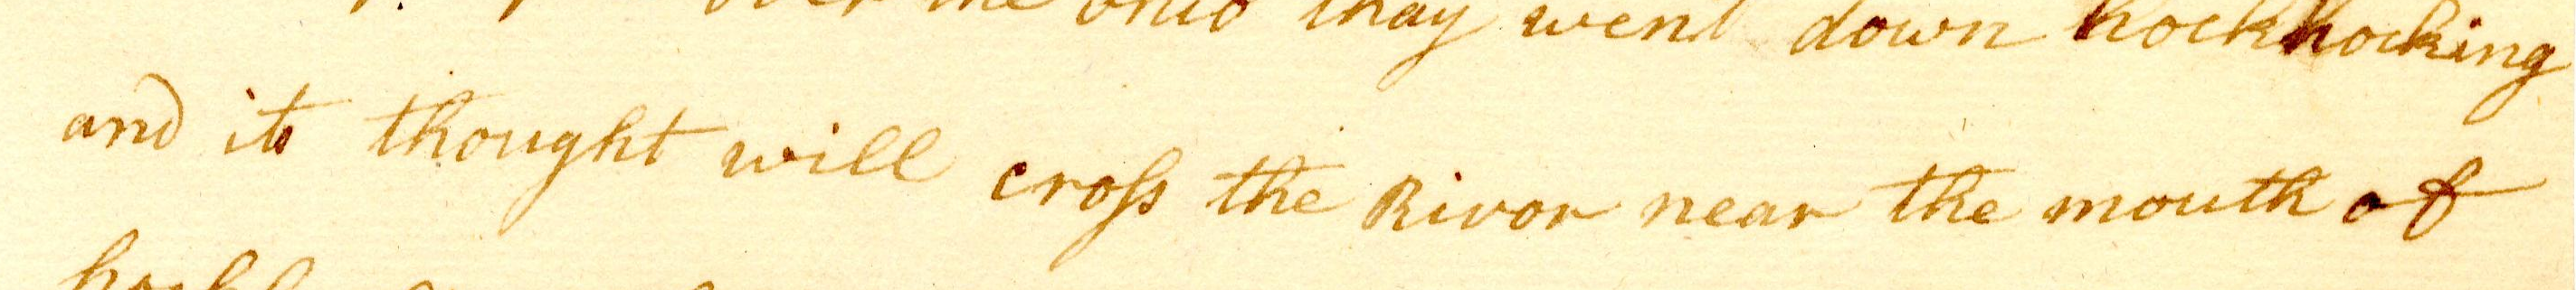and its thought will cross the Rivor near the mouth of
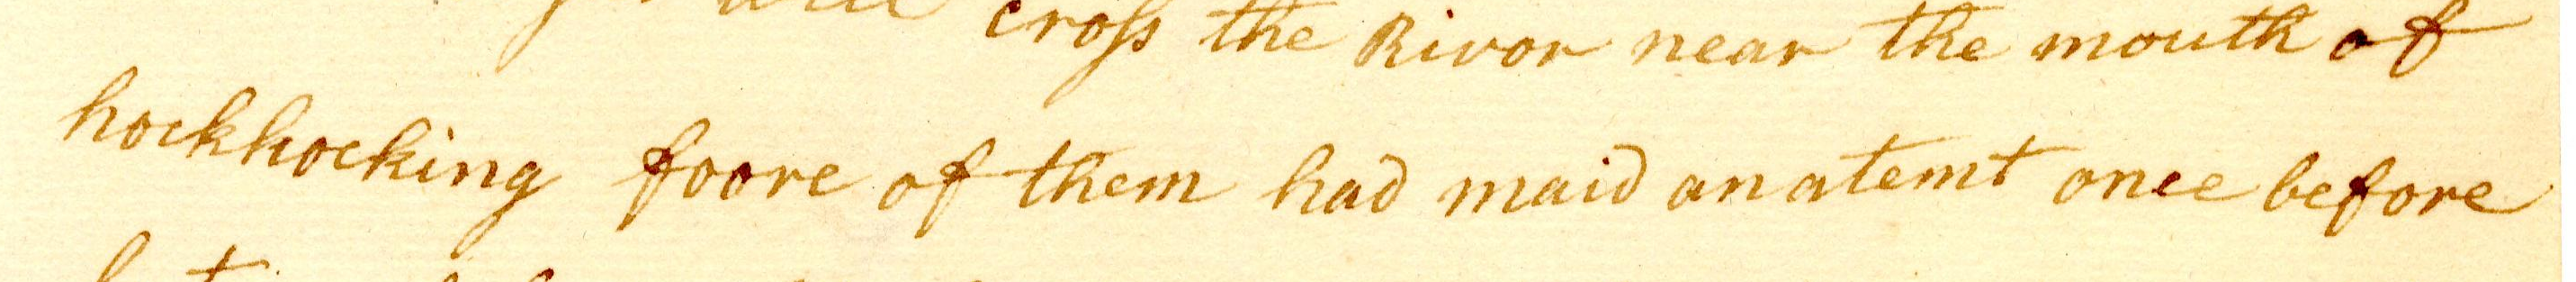hockhocking foore of them had maid an atemt once before
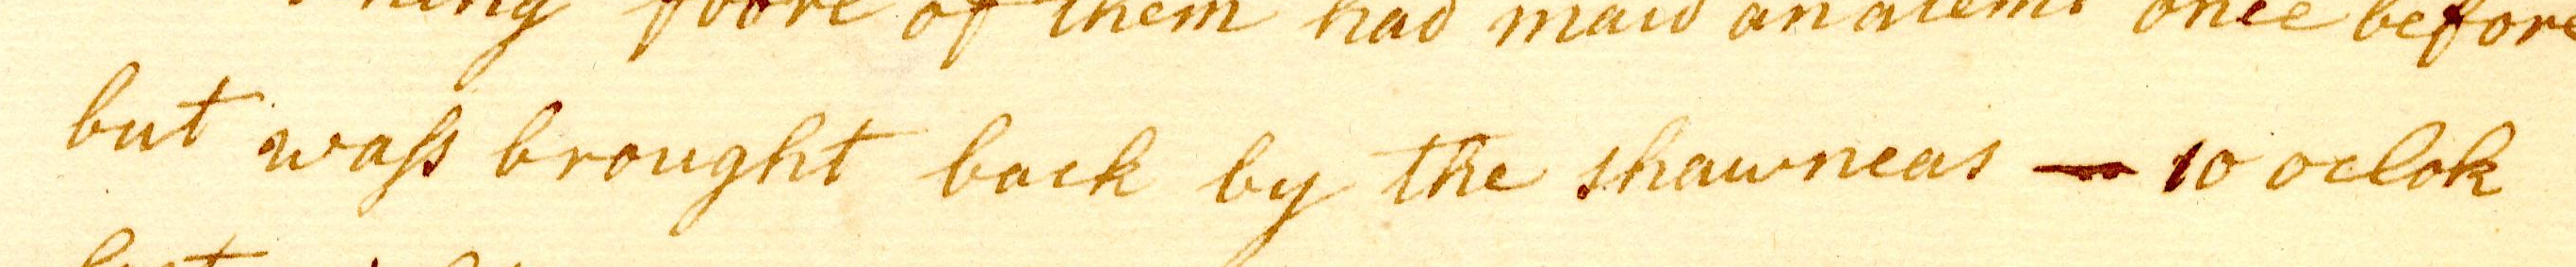but wass brought back by the shawneas- 10 oclok
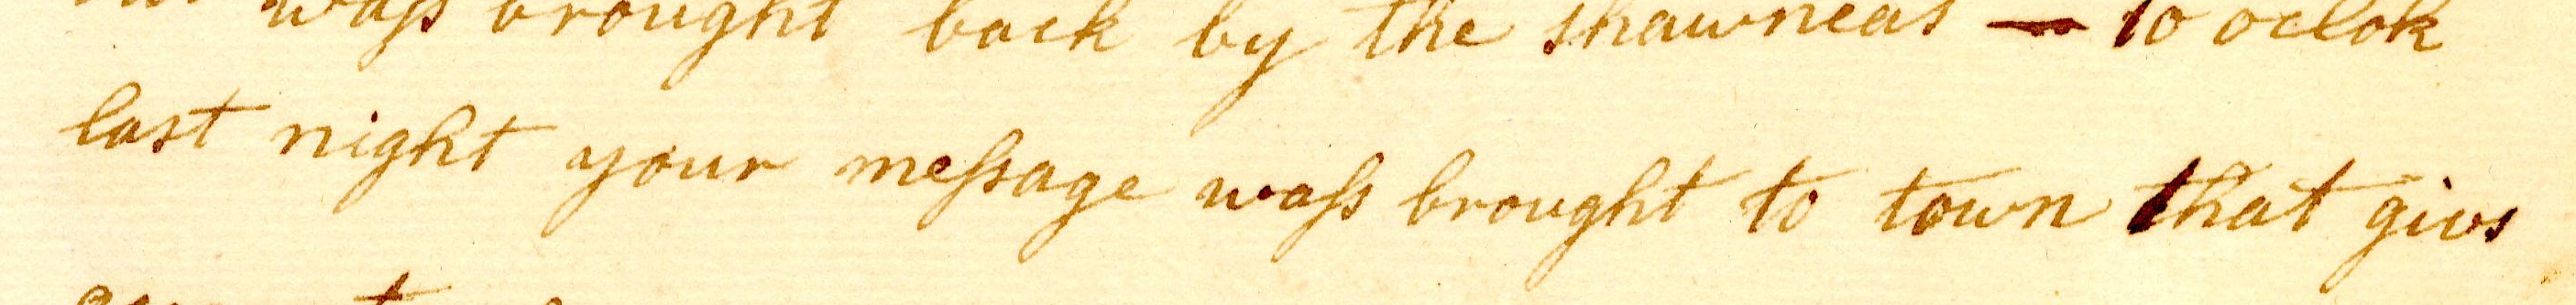last night your message wass brought to town that givs
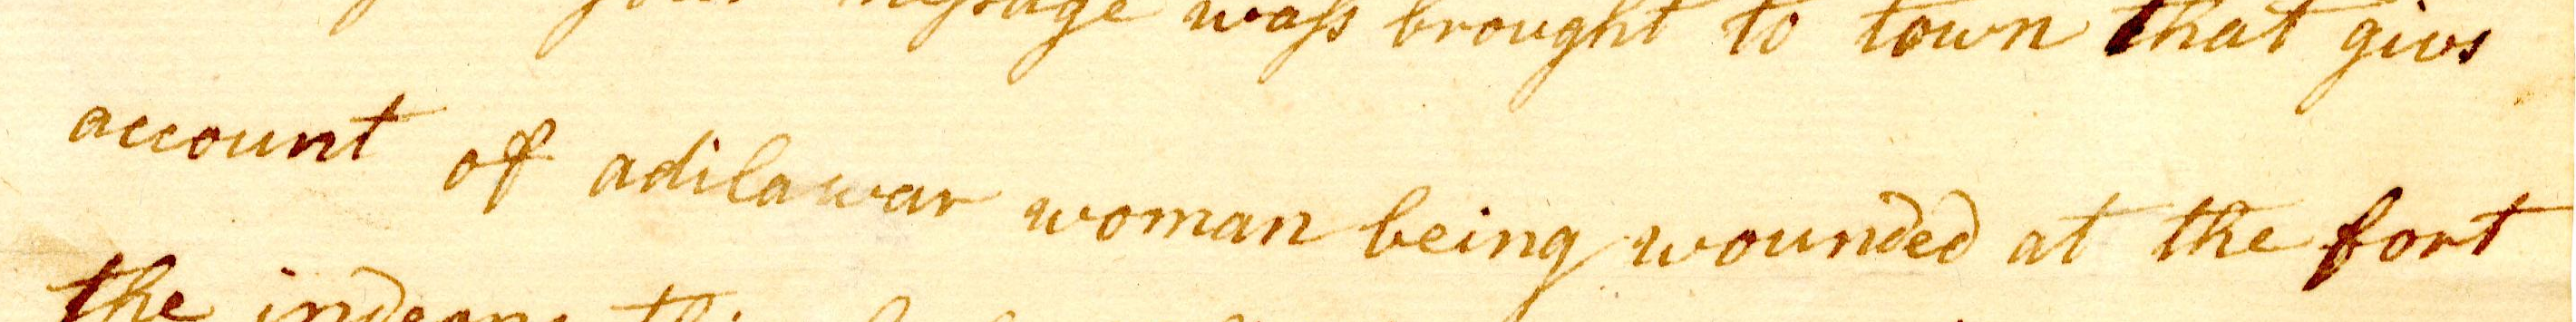account of a dilawar woman being wounded at the fort
